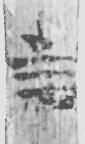十三
